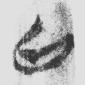㠯（以）
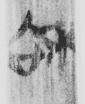和
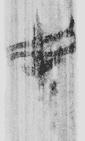民
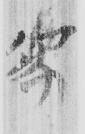虎
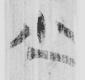少
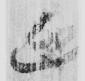臣
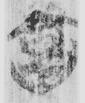合
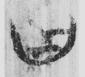曰
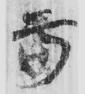可
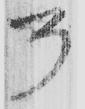乃
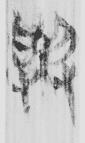與
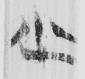少
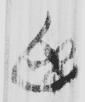臣
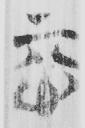{亓心}
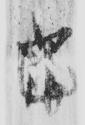{毋心}
